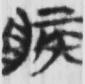疾
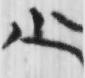少
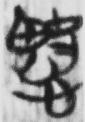○（氣）
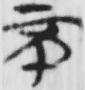不
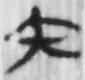內（入）
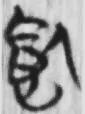○（食）
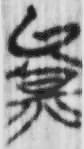○（爨）
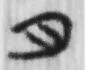月
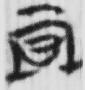○（期）
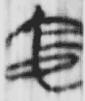○（中）
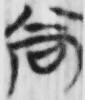尚
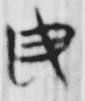母
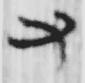又（有）
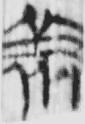羕（殃）
